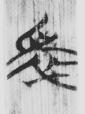卒B
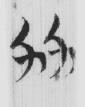{力力}
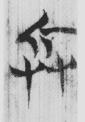兵
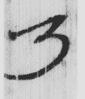乃
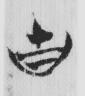由
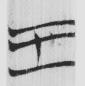王
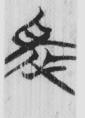卒B
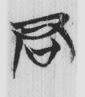君
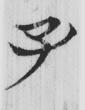子
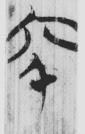{六千}
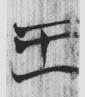王
